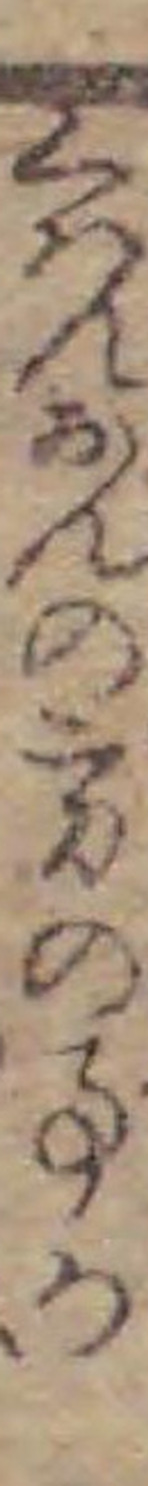くはんおんの方の事か
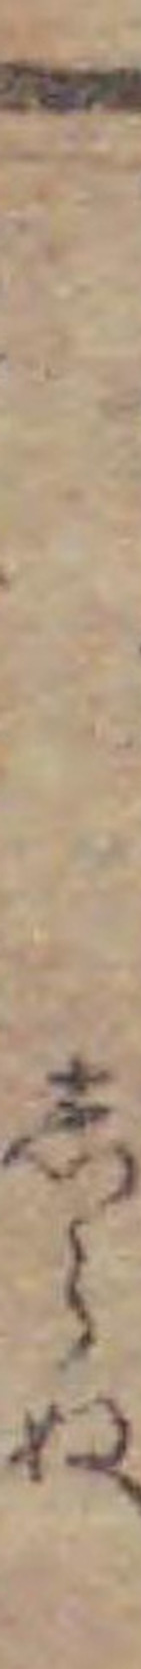しらぬ
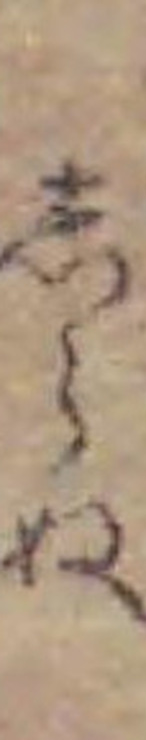しらぬ
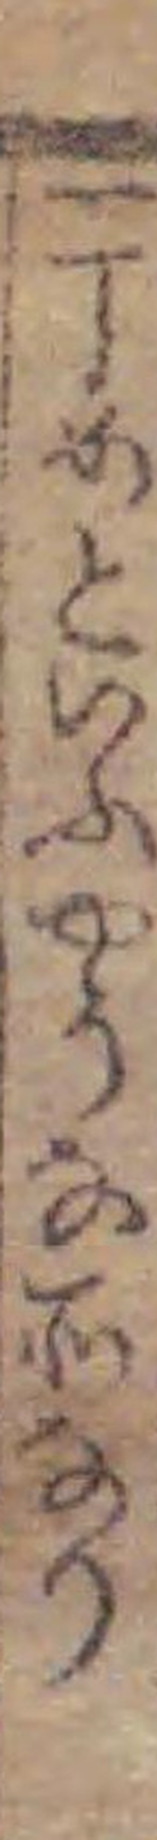一丁めといふやうな所なり

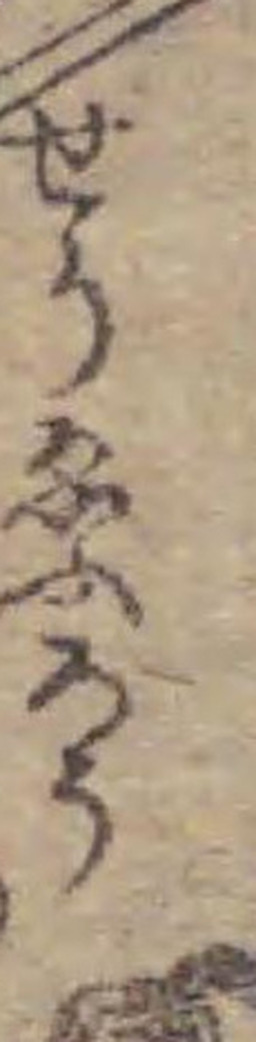せうゑふろう
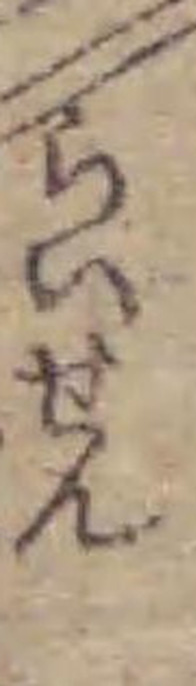らいせん
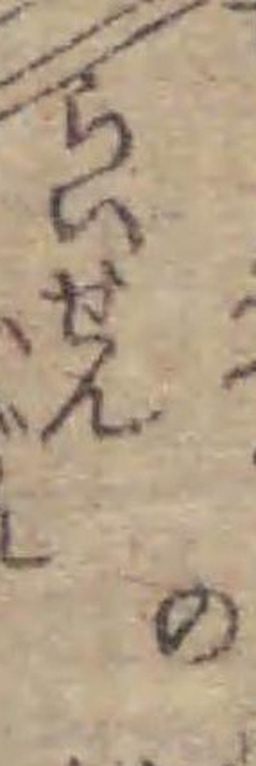らいせん

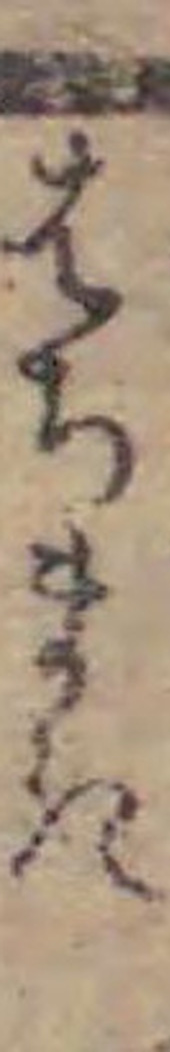はちまき
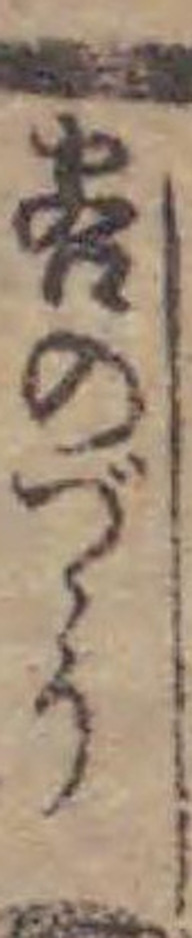客のづゝう
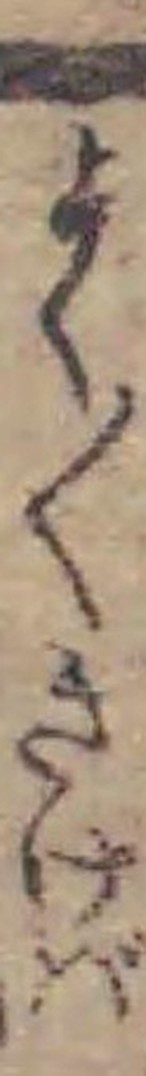よく〳〵きけば

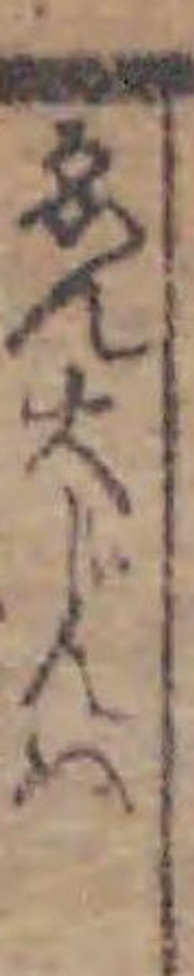ゑん大じんは
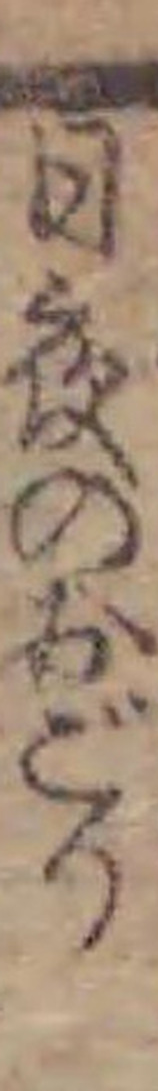日夜のおごり
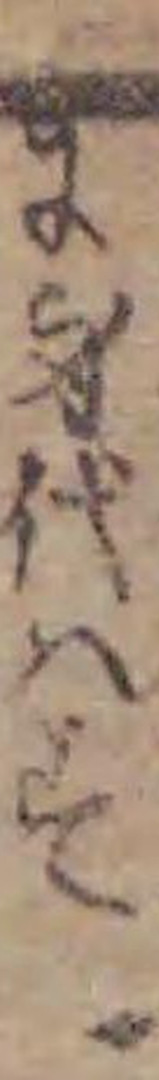に身代はす
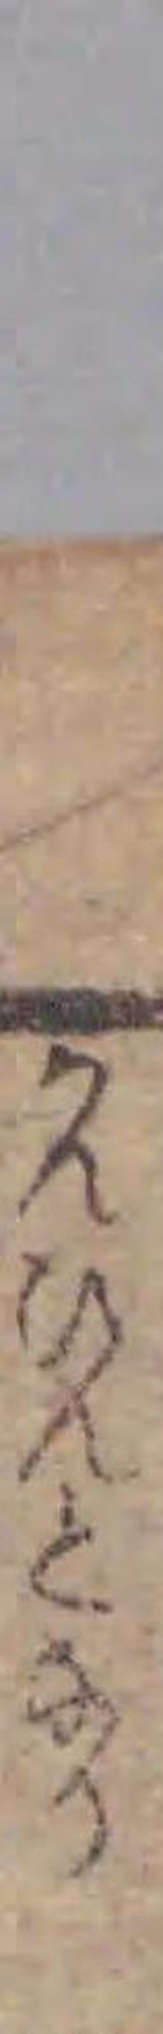かんひんとなり
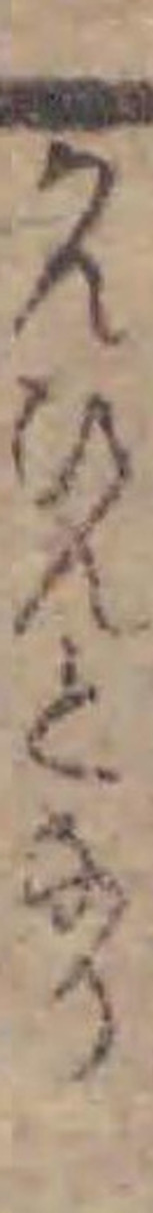かんひんとなり
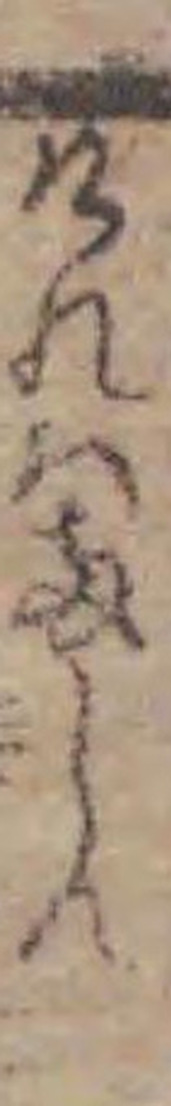けれは両しん
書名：此奴和日本 : 2巻
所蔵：国立国会図書館 National Diet Library, JAPAN
